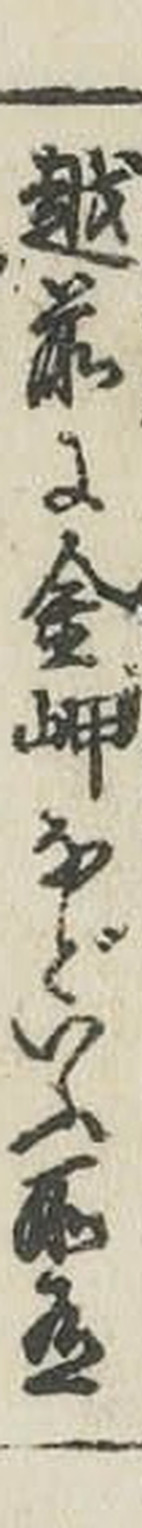越前に金岬などいふ所有
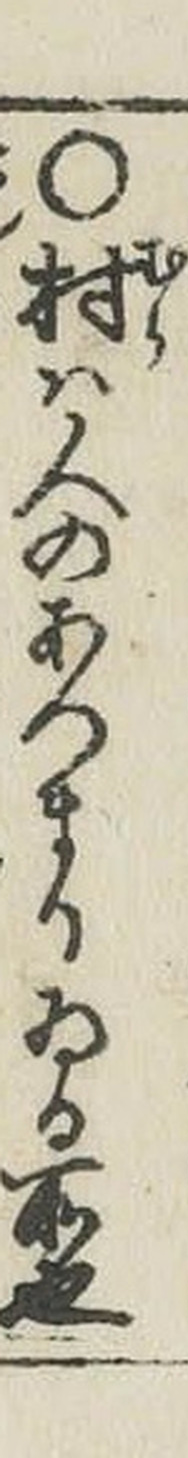○村は人のあつまりゐる所也
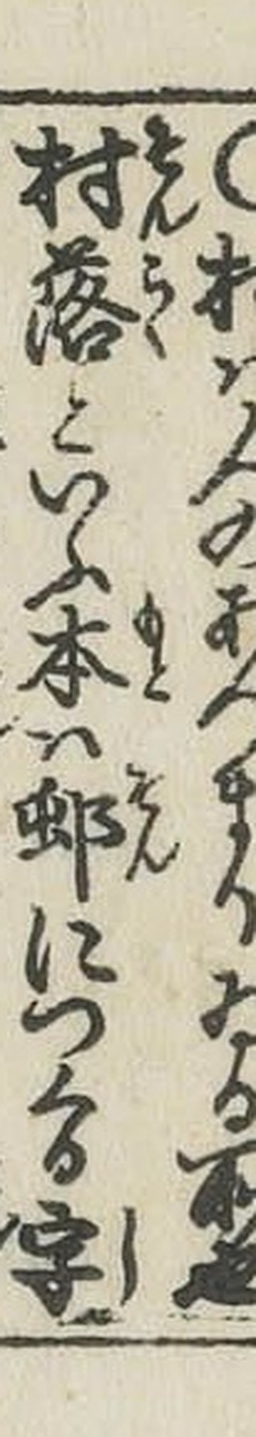村落といふ本は邨につくる字
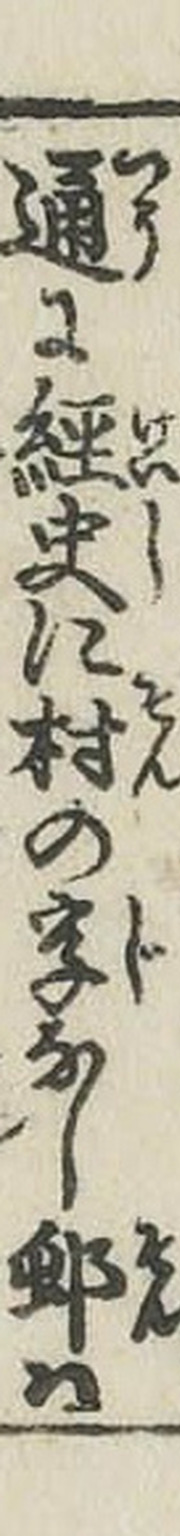通に経史に村の字なし邨は
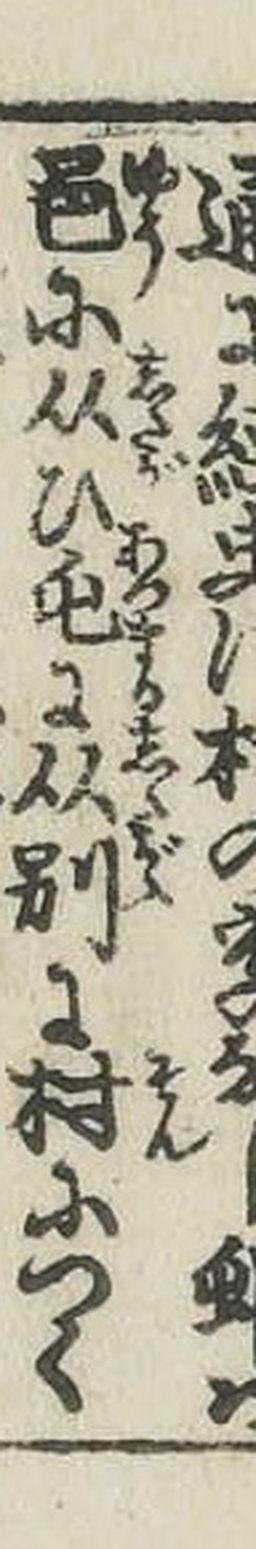邑に従ひ屯に従別に村につく
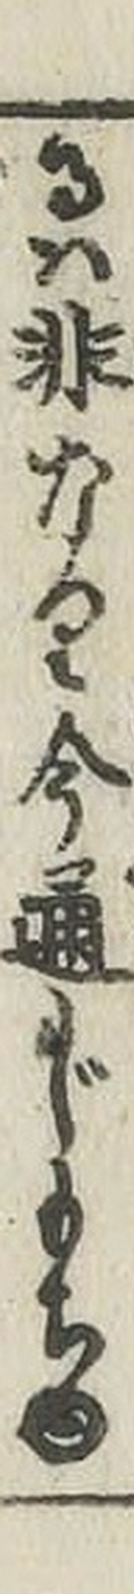るは非なり今通じもちゆ
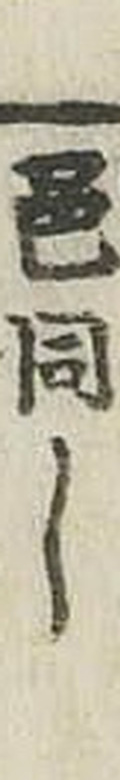邑同し
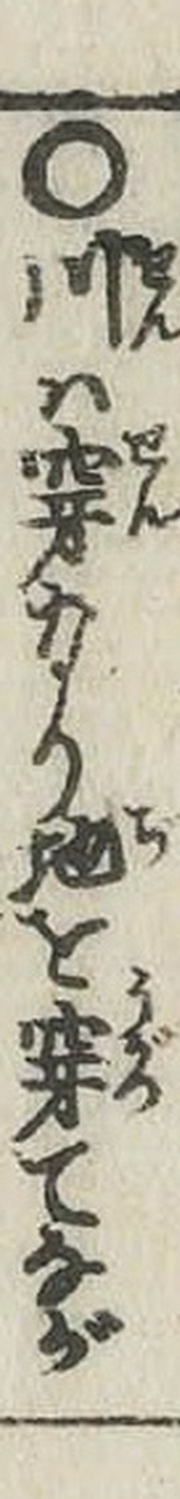○川は穿なり地を穿てなが
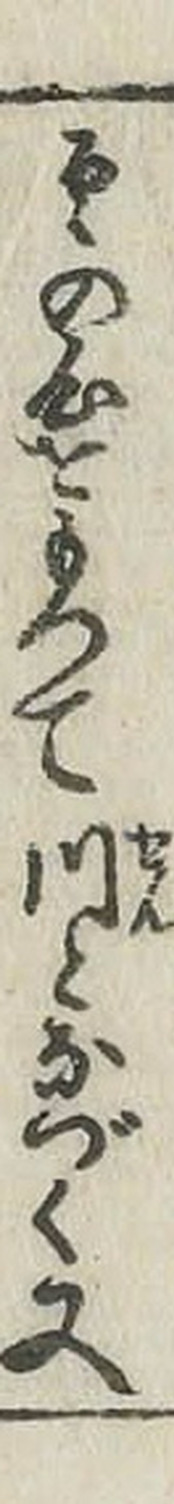るゝの心をもつて川となづく又
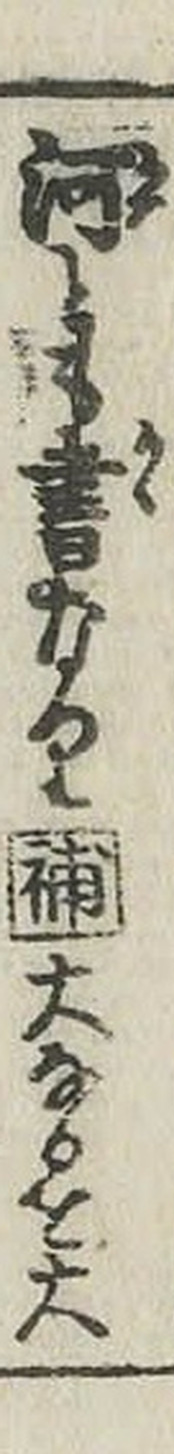河とも書なり補大なるを大
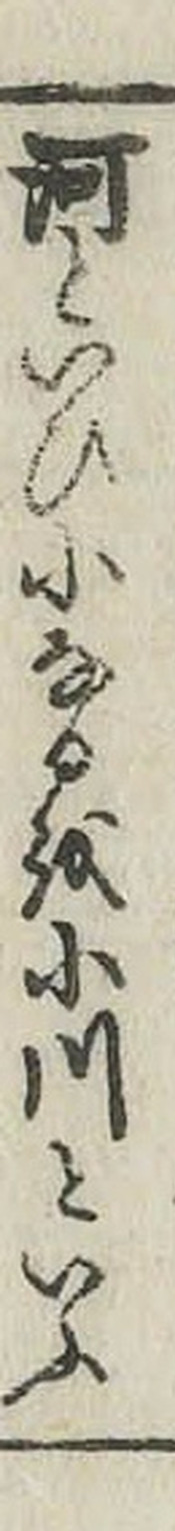河といひ小なるを小川といふ
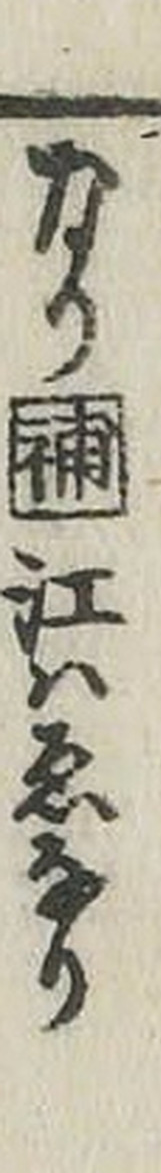なり補江はゑなり

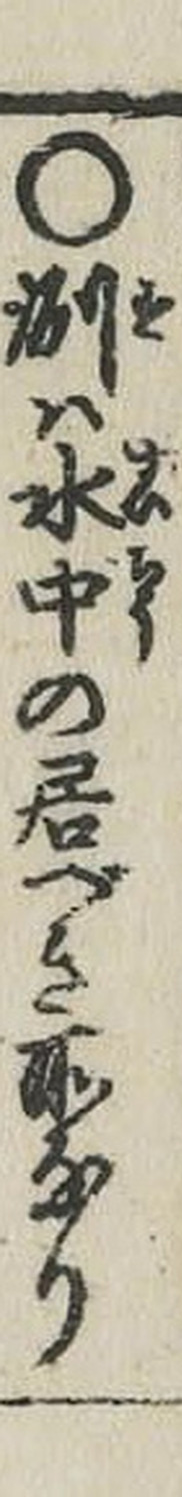○洲は水中の居べき所なり
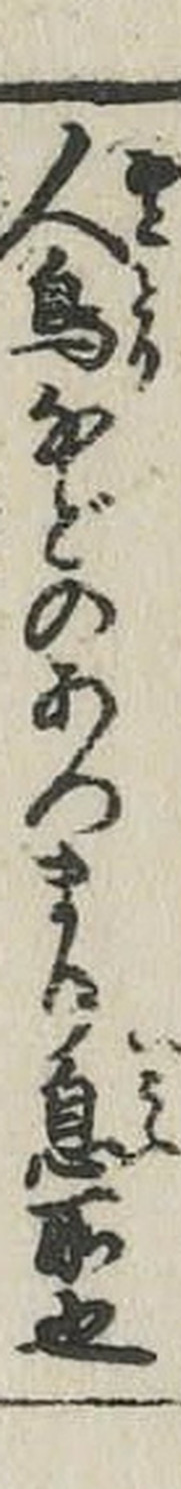人鳥などのあつまる息所也
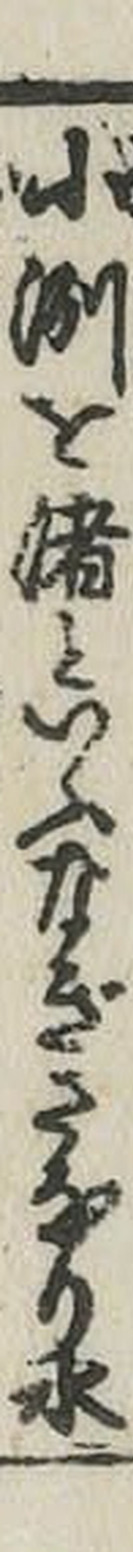小洲を渚といふなぎさなり水
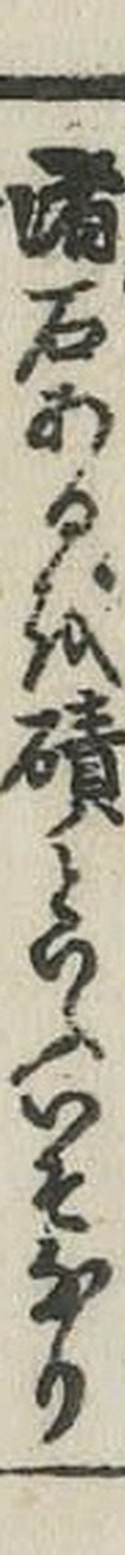渚石あるを磧といふいそなり
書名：増補頭書訓蒙図彙大成 10巻 2:巻之1-3
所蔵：東京学芸大学教育コンテンツアーカイブ
